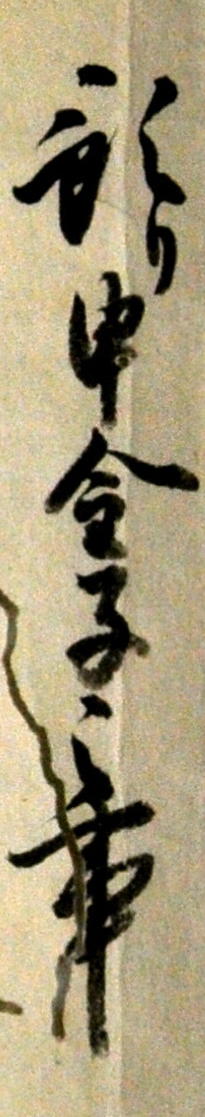預り申金子之事
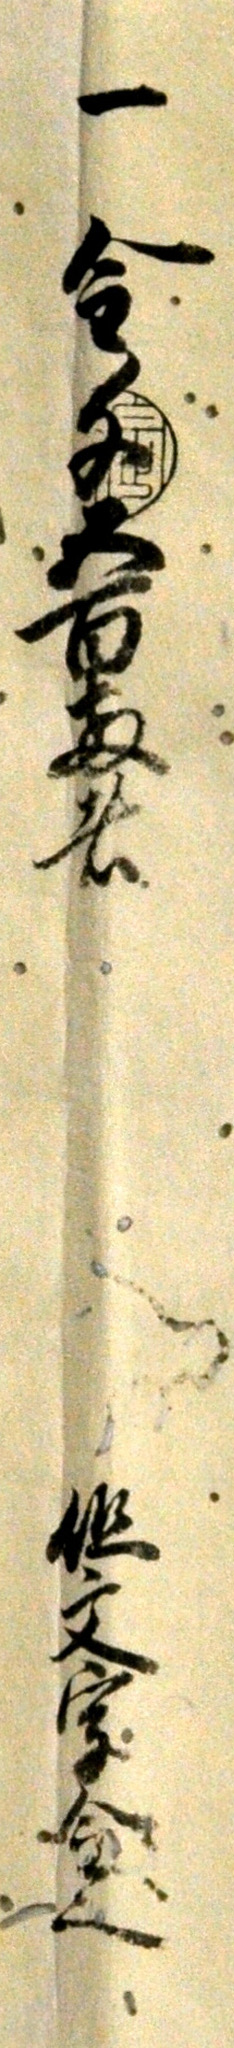一金千五百両は但文字金也
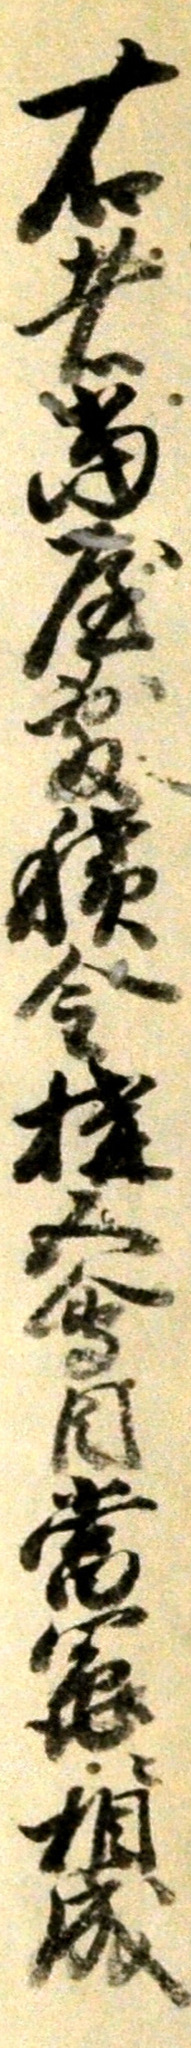右は当屋敷積金構五会目当鬮に相成
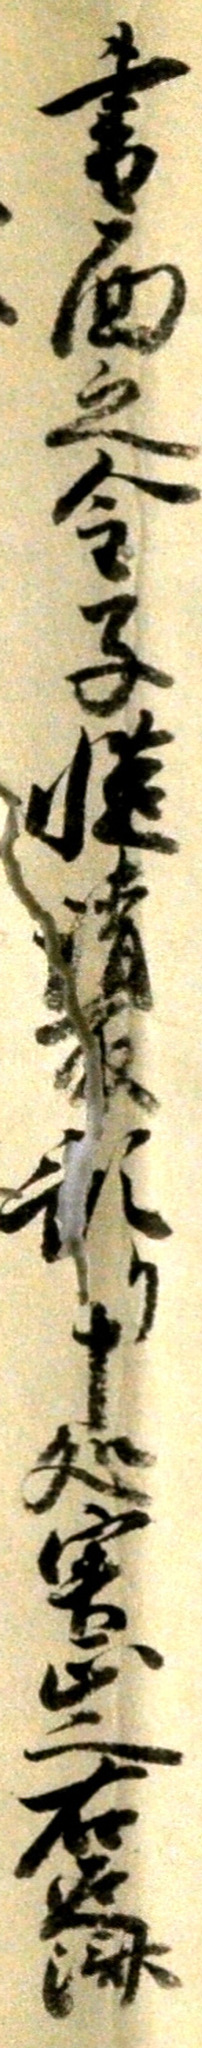書面之金子慥請取預り申処実正也右返済
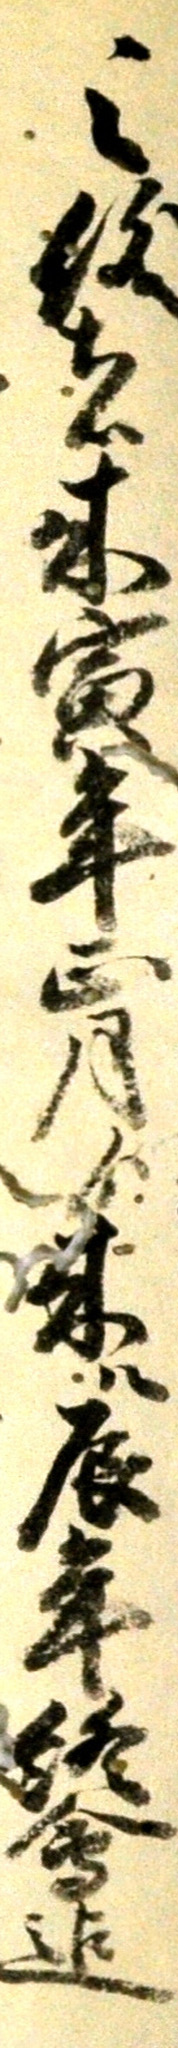之儀は来寅年正月ゟ来ル辰年終会迄
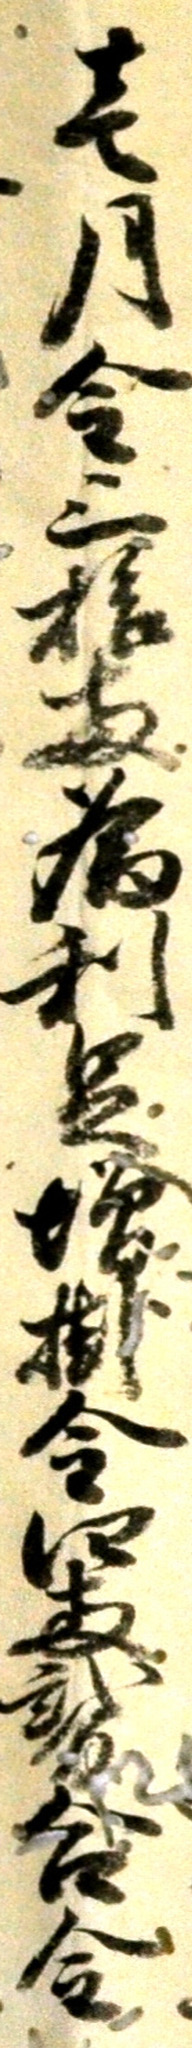壱月金三拾両為利足増掛金四両弐分合金
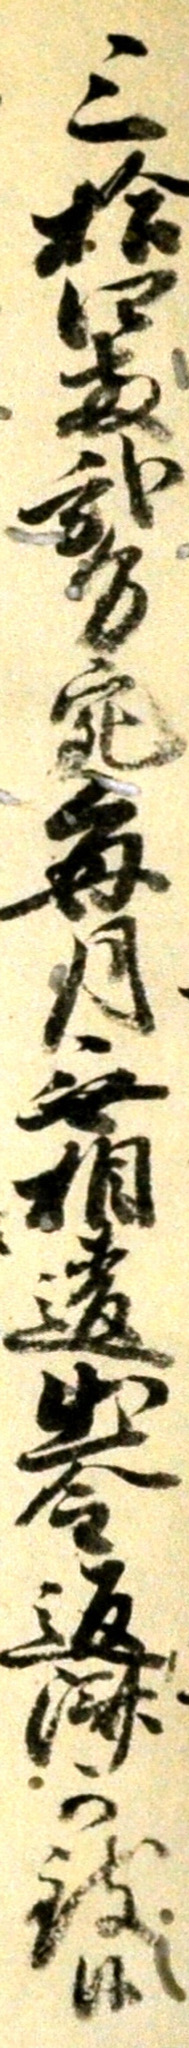三拾四両弐分宛毎月無相違出金返済可致候
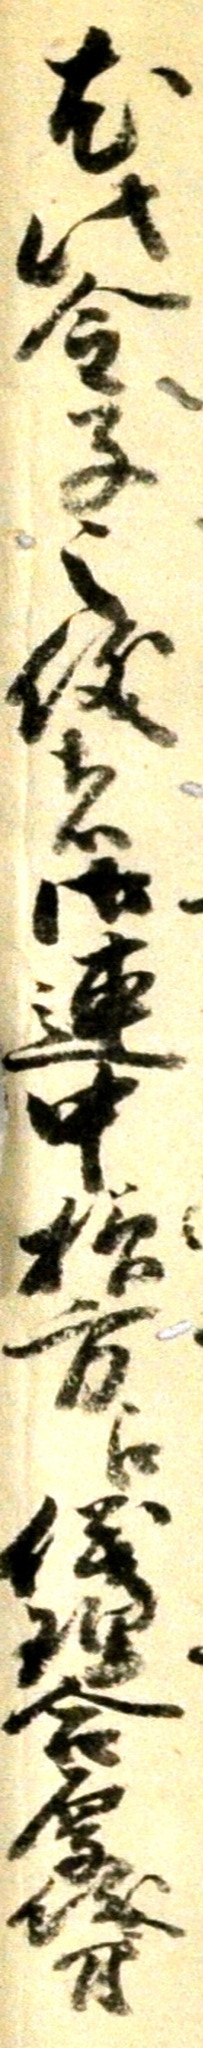尤此金子之儀は御連中様方え儀理合厚儀に付
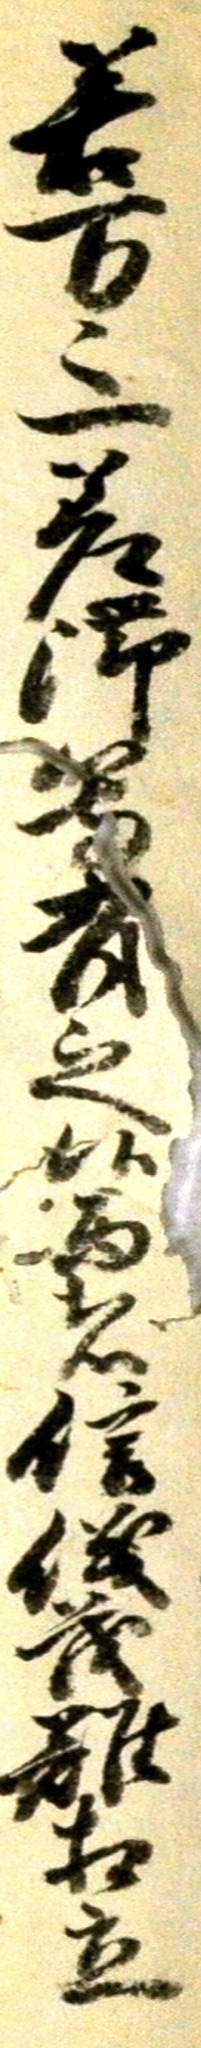若万々一差滞等有之候ては信儀も難相立
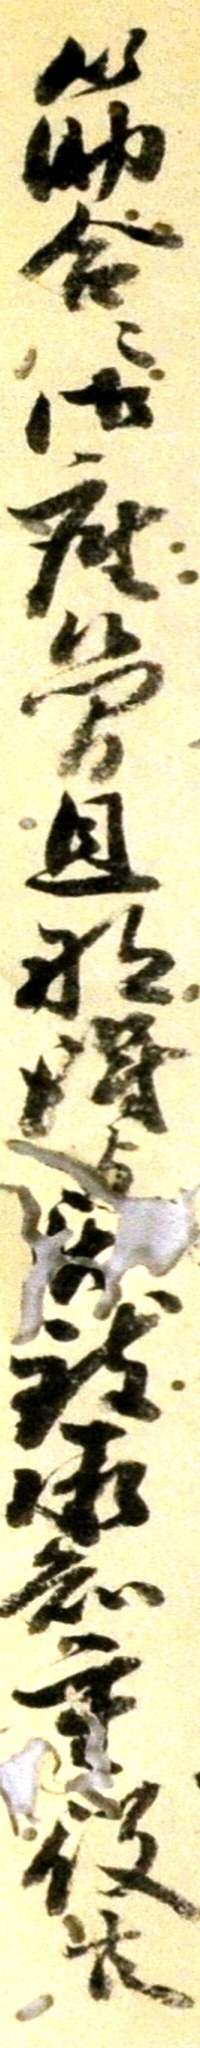筋合に御座候間旦那得と被致承知重役共
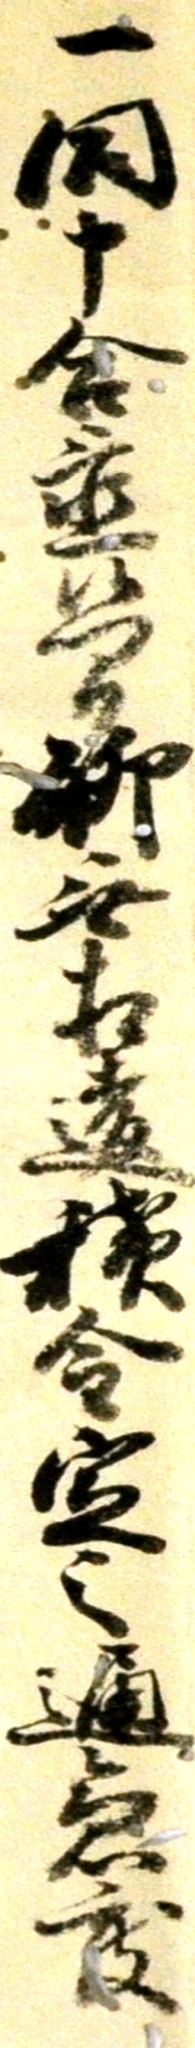一同申合置候間聊無相違積金定之通急度
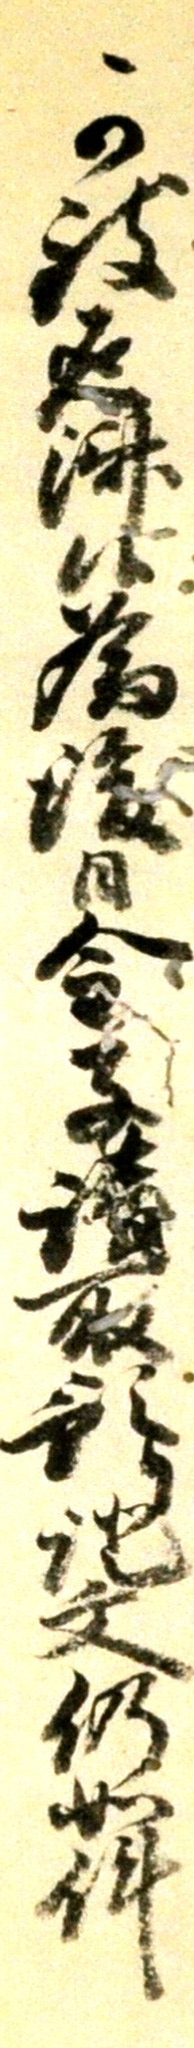可致返済候為後日金子請取預り証文仍如件
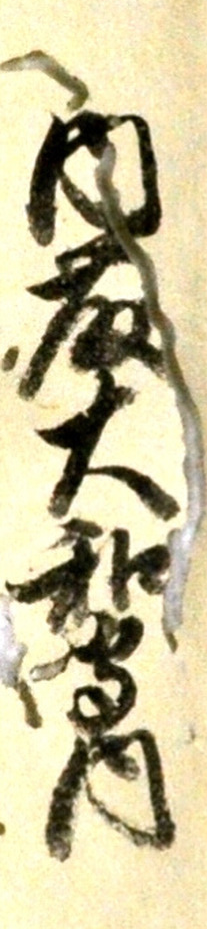内藤大和守内
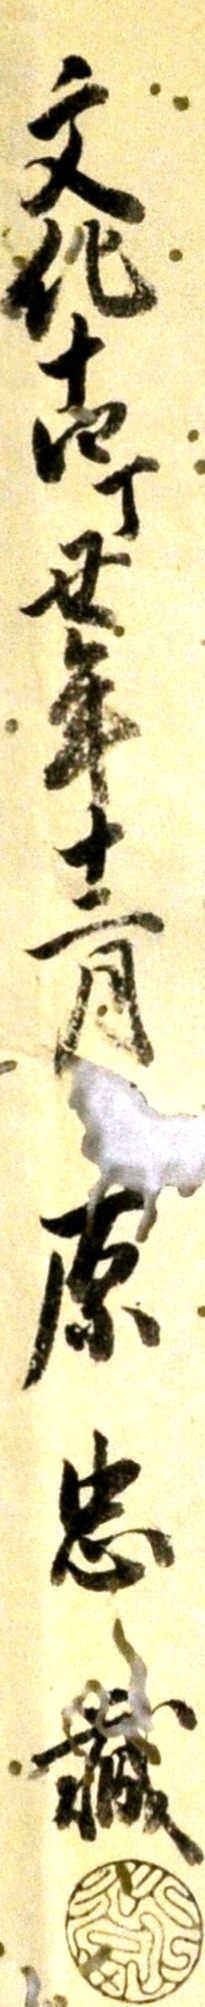文化十四丁丑年十二月原忠蔵㊞
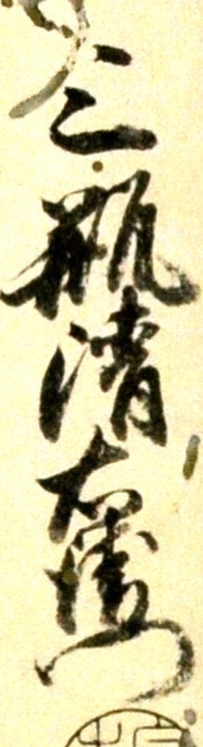三瓶清右衛門㊞
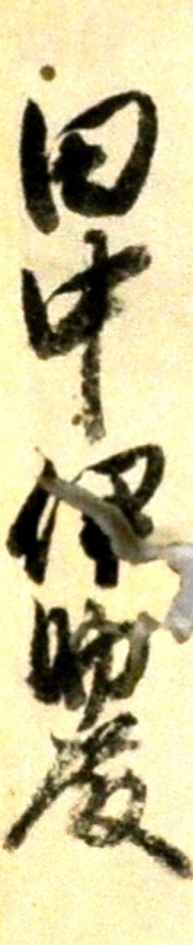田中伊助殿
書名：預り申金子之事
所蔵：伊那市立高遠町図書館・合同会社AMANE
